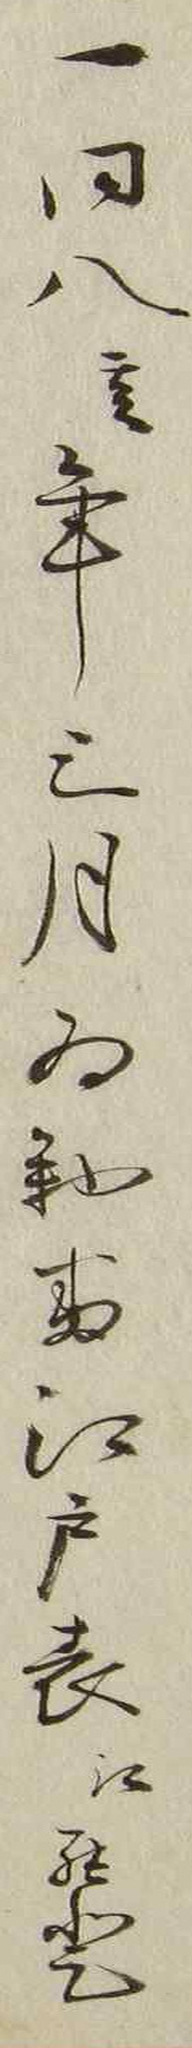一同八亥年三月為勤番江戸表え罷登
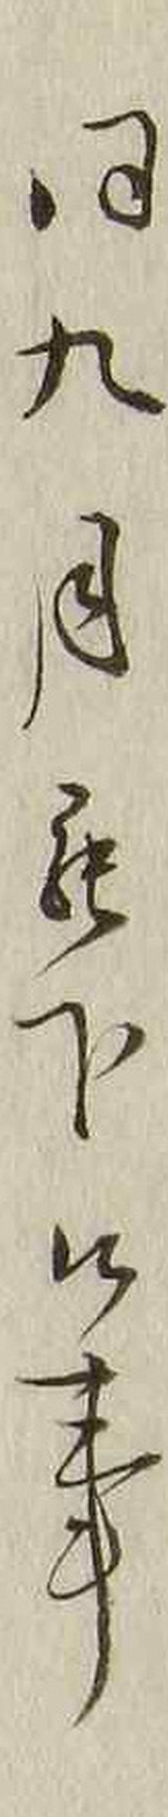同九月罷下候事
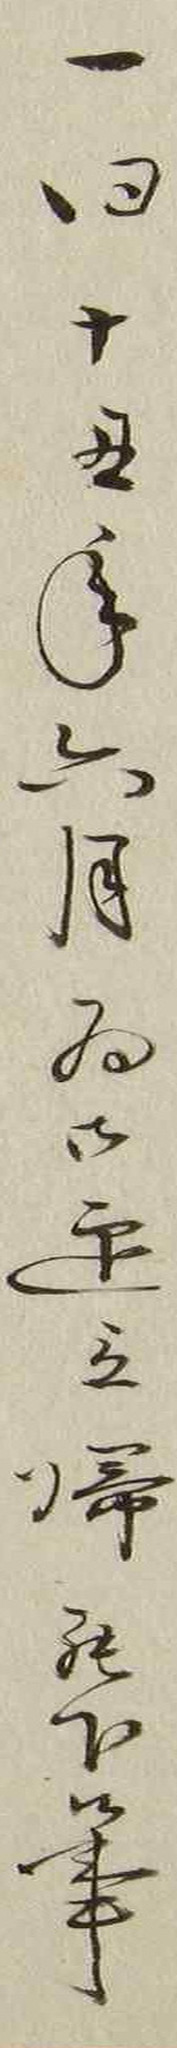一同十丑年六月為御迎立帰罷下候事
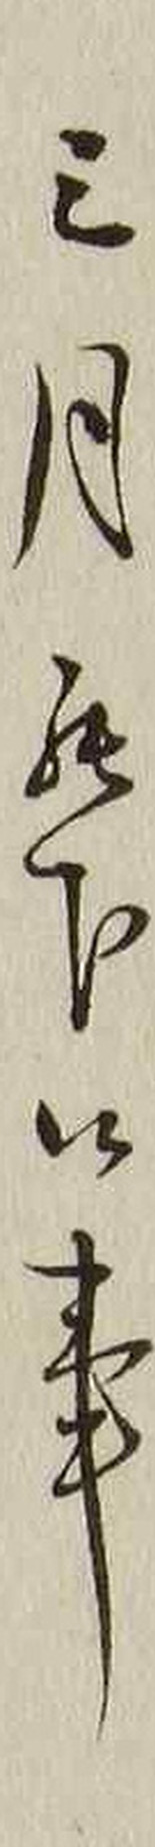三月罷下候事
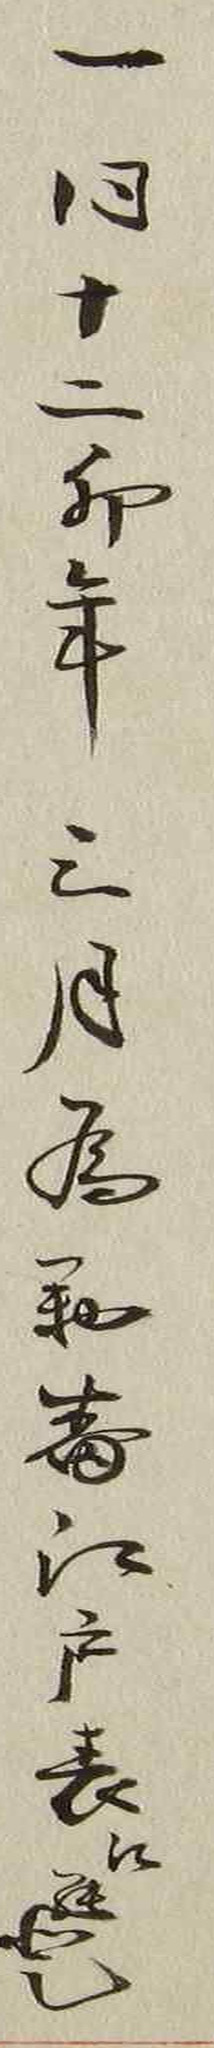一同十二卯年三月為勤番江戸表え罷登
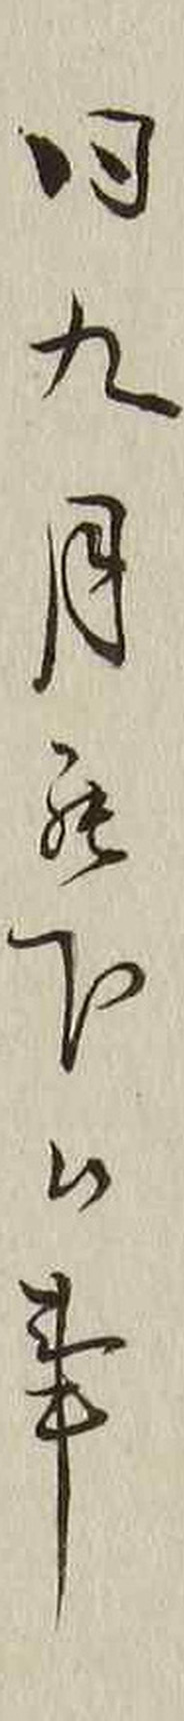同九月罷下候事
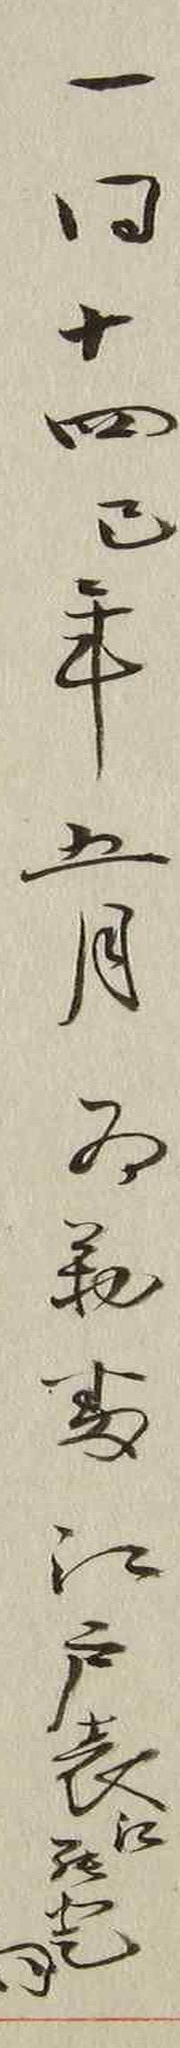一同十四巳年五月為勤番江戸表え罷登同
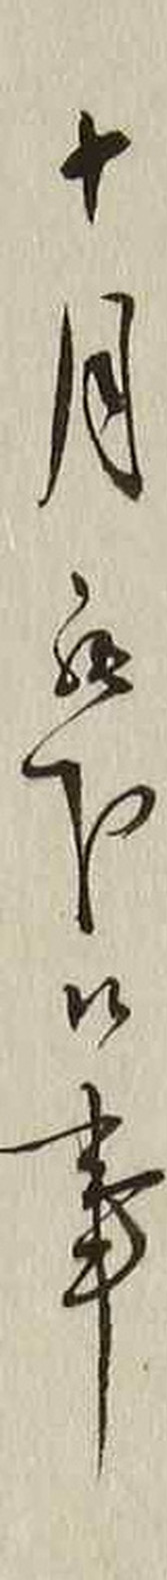十月罷下候事
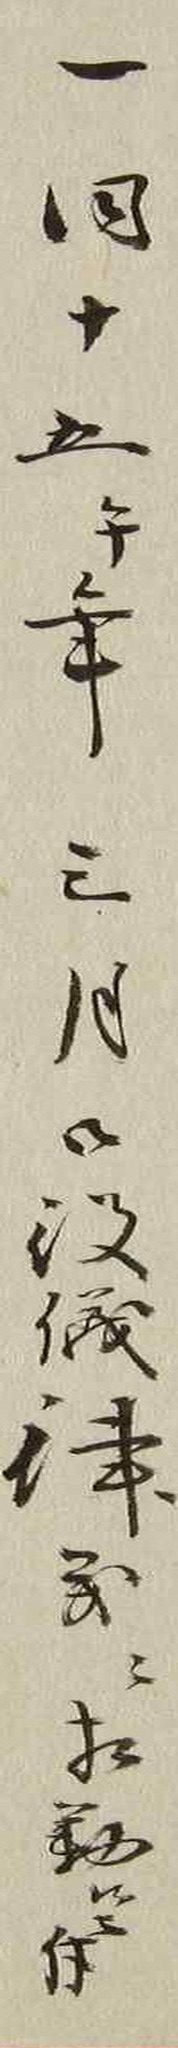一同十五午年三月御役儀律義に相勤候に付
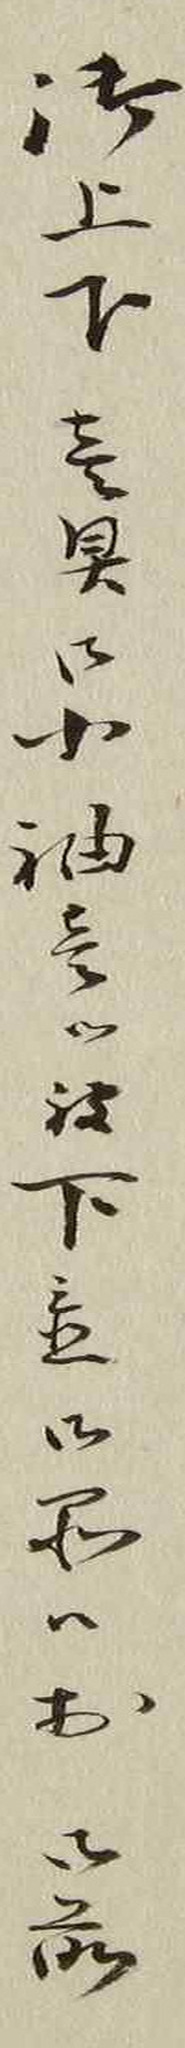御上下壱具御小袖壱つ被下置御品は於御前
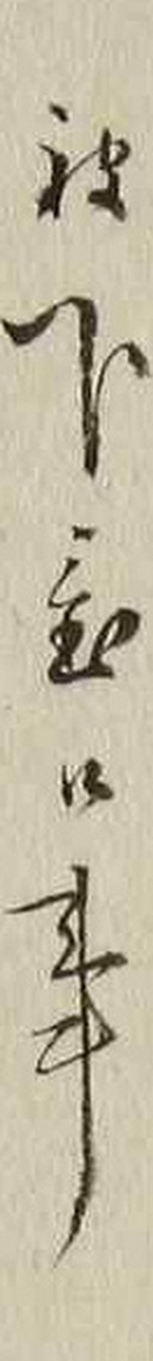被下置候事
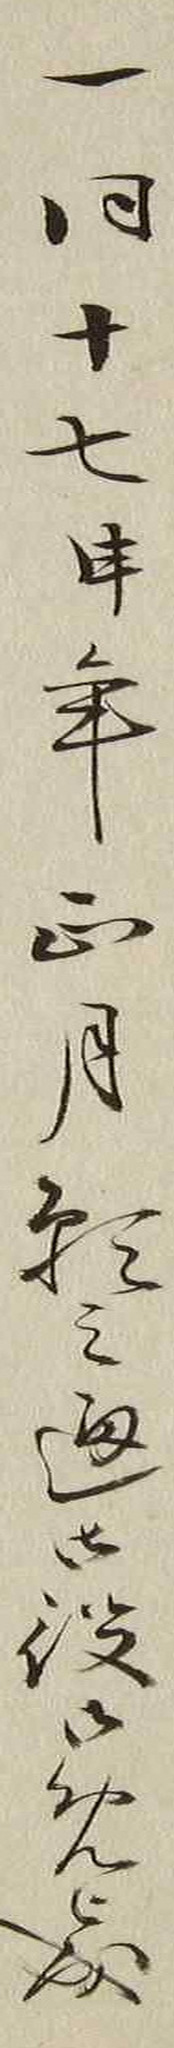一同十七申年正月願之通御役御免被成
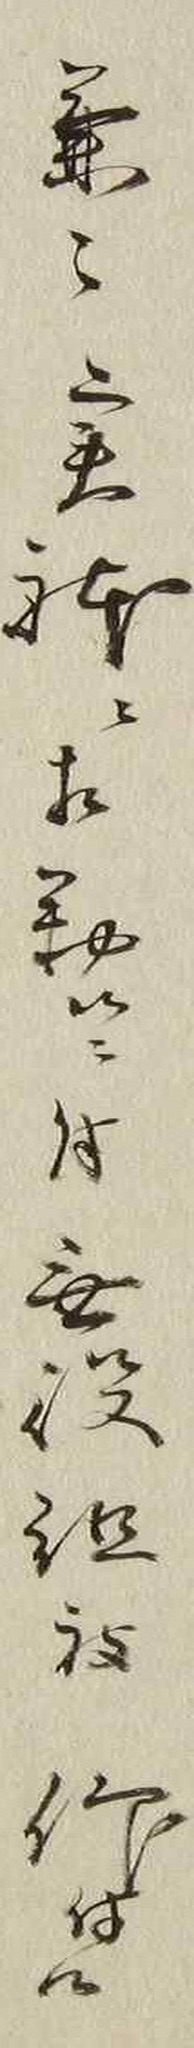兼々実体に相勤候に付無役組被仰付候
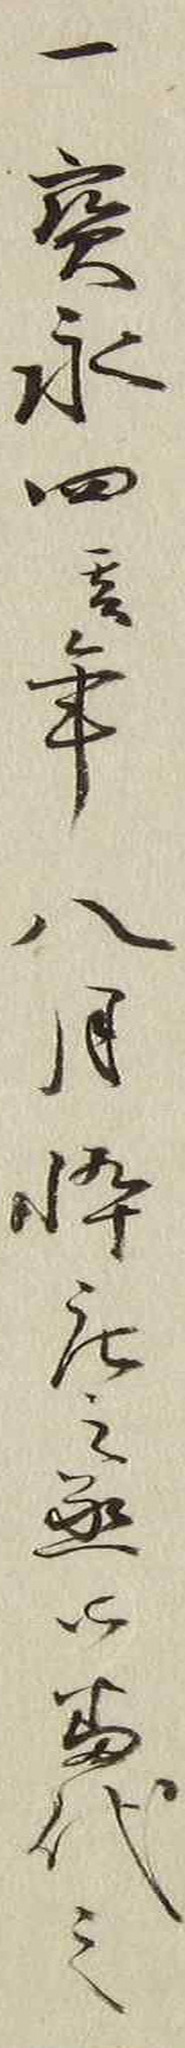一宝永四亥年八月悴庄之丞御番代之
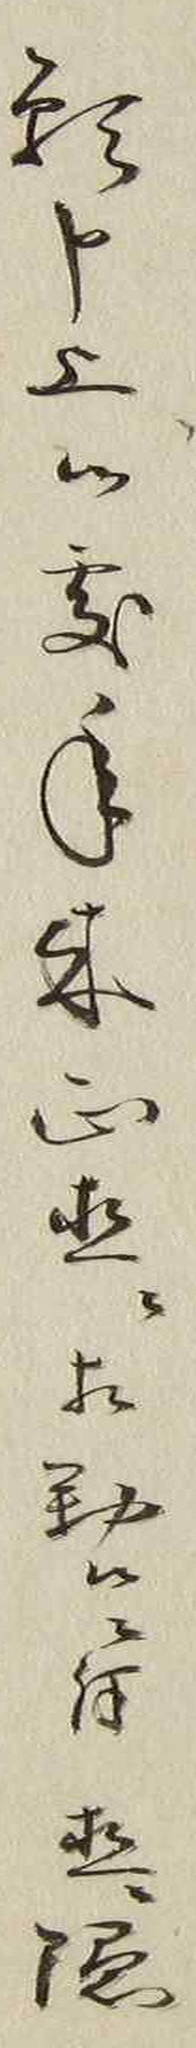願申上候処年来正直に相勤候に付直に隠
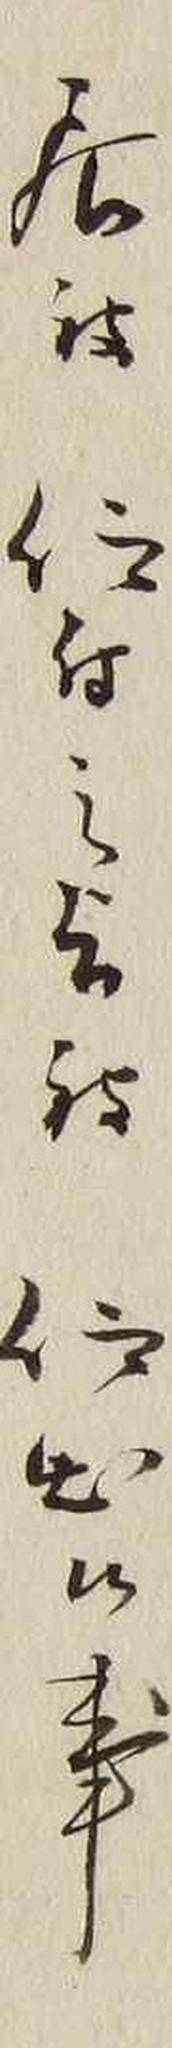居被仰付之旨被仰出候事
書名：諸士系譜　巻之157　ね之部1
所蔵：会津若松市立会津図書館
